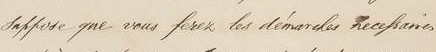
suppose que vous ferez les démarches necessaires
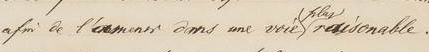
afin de l'amener dans une voie plus raisonable.
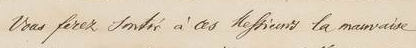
Vous ferez sentir à ces Messieurs la mauvaise
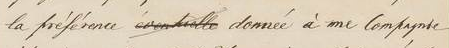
la préférence éventuelle donnée à une Compagnie
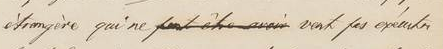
étrangère qui ne fait être avoir veut pas exécuter
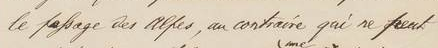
le passage des Alpes, au contraire qui ne peut
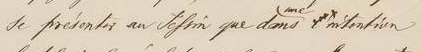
se présenter au Tessin que dans unel'intention
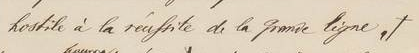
hostile à la réussite de la grande ligne, †
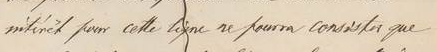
intérêt pour cette ligne ne pourra consister que
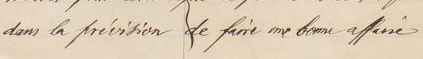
dans la prévision de faire une bonne affaire
